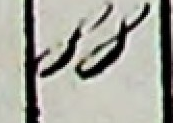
88
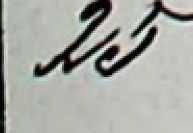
25
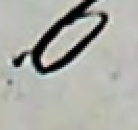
6
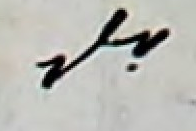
do
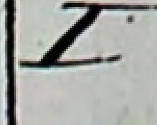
I
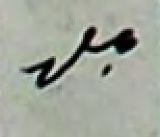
do
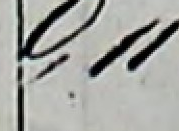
0,11
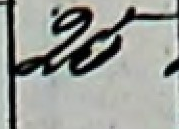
25
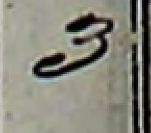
3
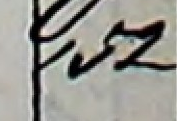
0,52
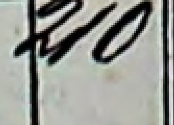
210
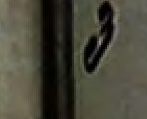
3
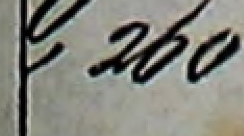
0,260
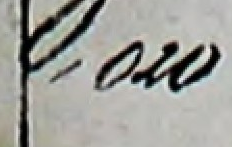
0,020
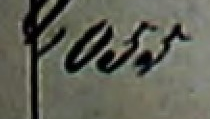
0,055
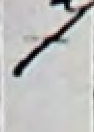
7
